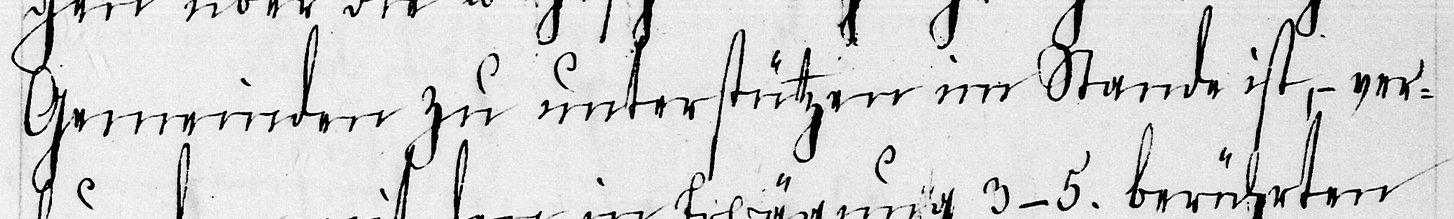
Gemeinden zu unterstützen im Stande ist, – ver¬
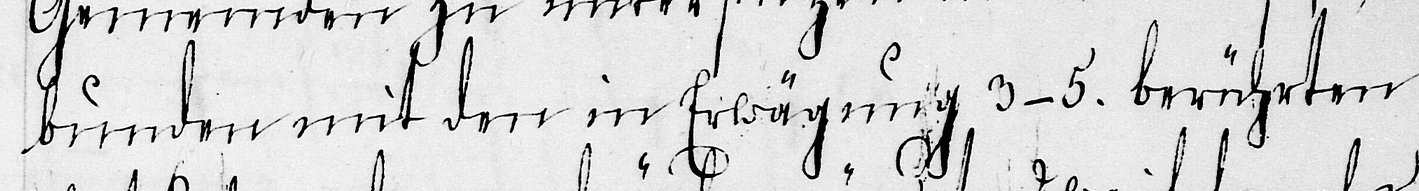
bunden mit den in Erwägung 3–5. berührten
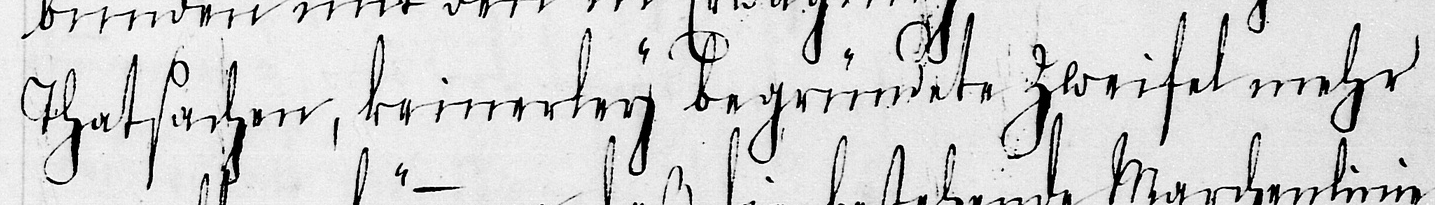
Thatsachen, keinerley begründete Zweifel mehr
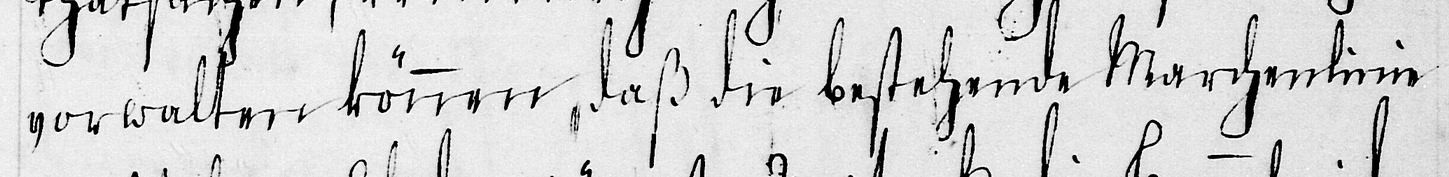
vorwalten können, daß die bestehende Marchenlinie
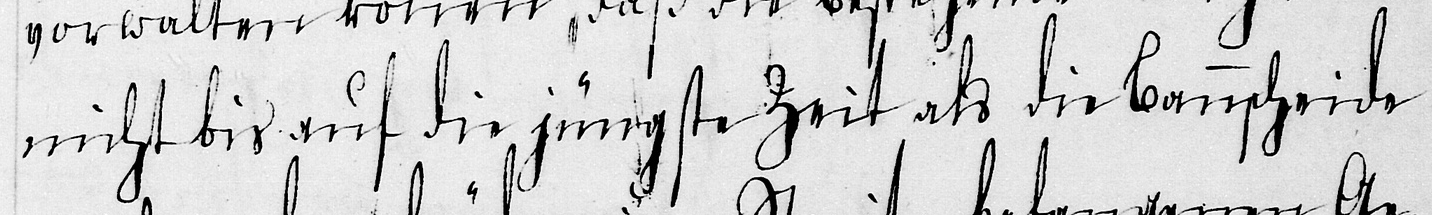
nicht bis auf die jüngste Zeit als die Bannscheide
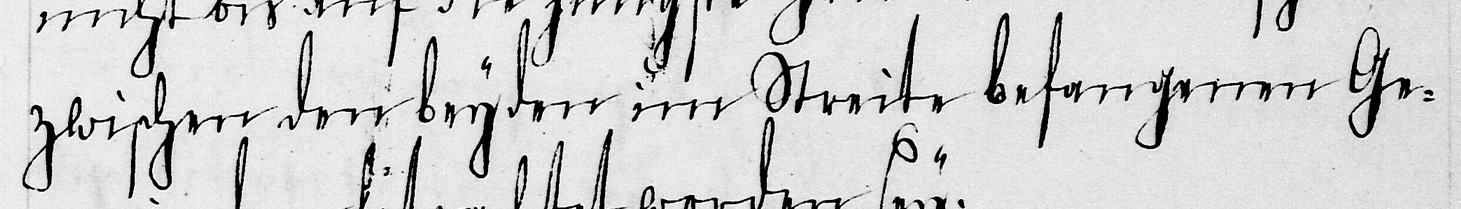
zwischen den beyden im Streite befangenen Ge¬
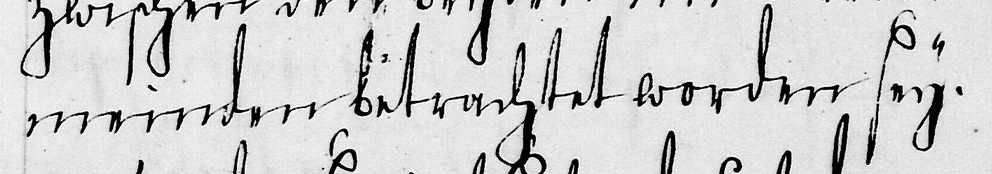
meinden betrachtet worden sey.
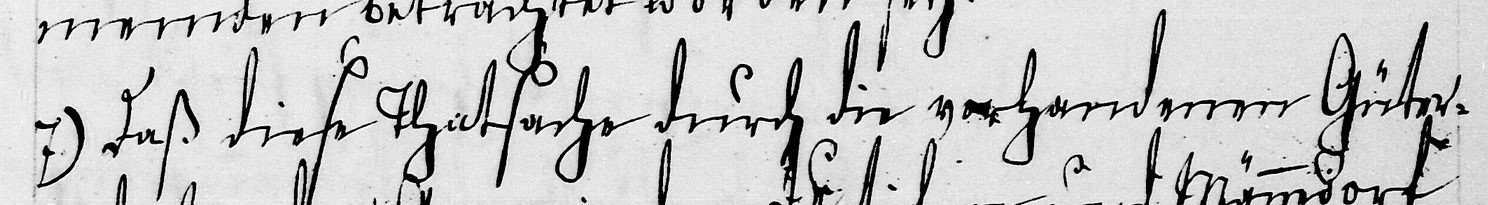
7.) Daß diese Thatsache durch die vorhandenen Güte¬
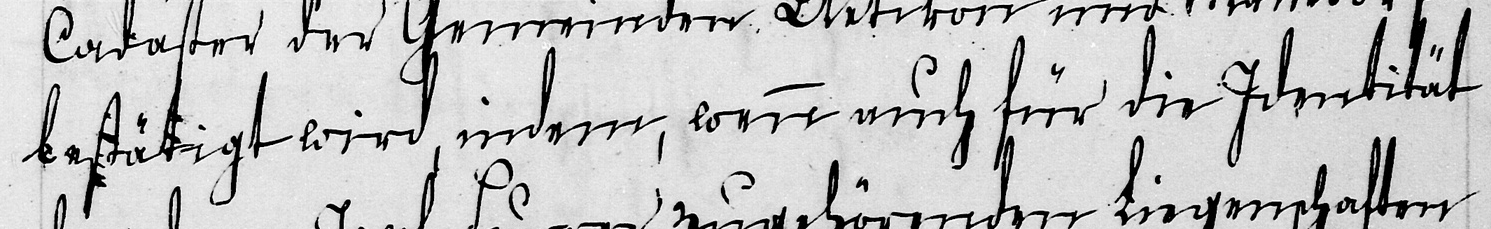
bestätigt wird, indem, wenn auch für die Identität
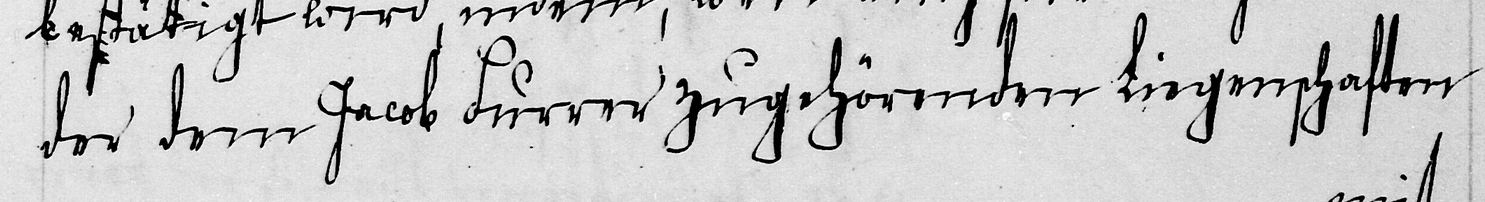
der dem Jacob Furrer zugehörenden Liegenschaften
